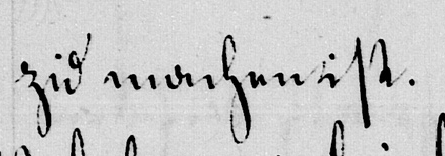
zu machen ist.
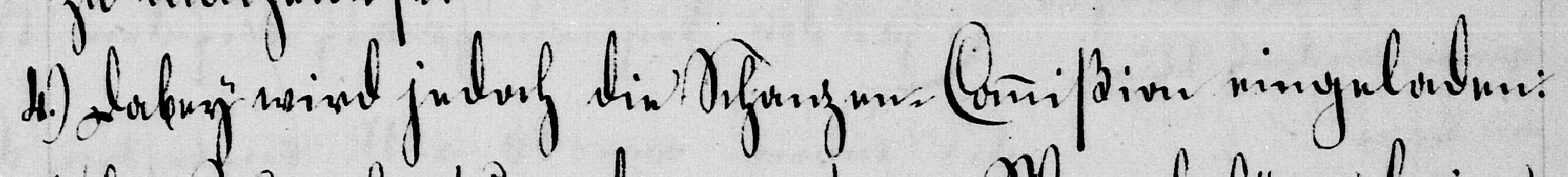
4.) Dabey wird jedoch die Schanzen-Commißion eingeladen:
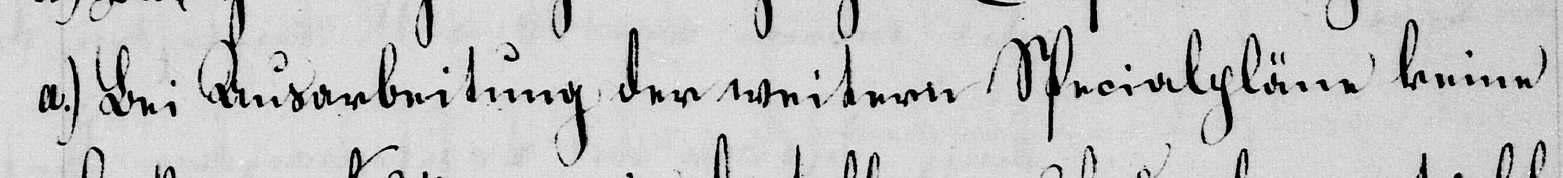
a.) Bei Ausarbeitung der weitern Specialpläne keine
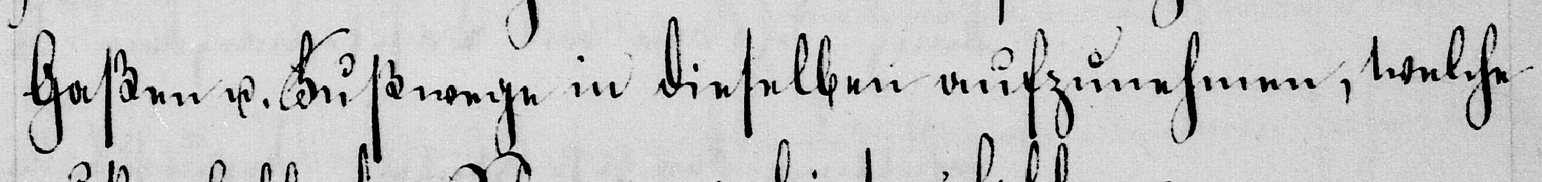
Gaßen u. Fußwege in dieselben aufzunehmen, welche
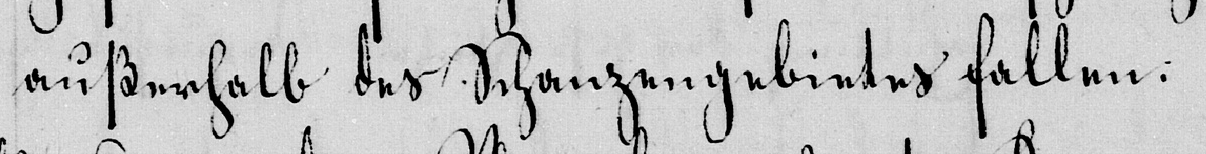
außerhalb des Schanzengebietes fallen.
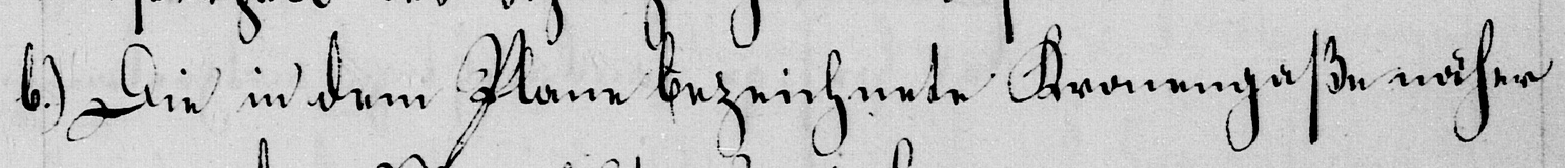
b.) Die in dem Plane bezeichnete Kronengaße näher
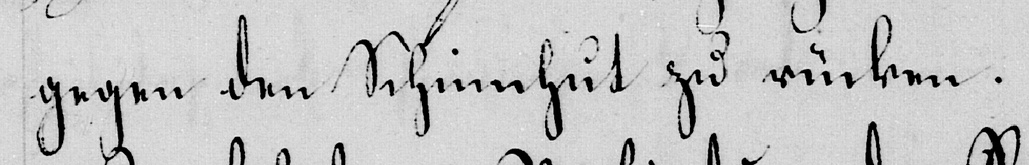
gegen den Schienhut zu rücken.
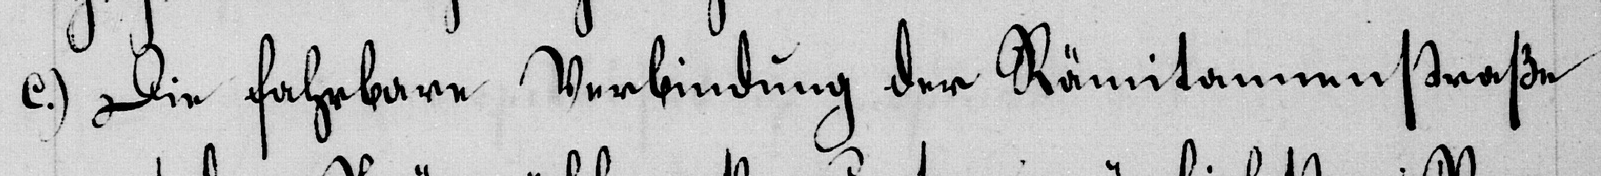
c.) Die fahrbare Verbindung der Rämitannenstraße
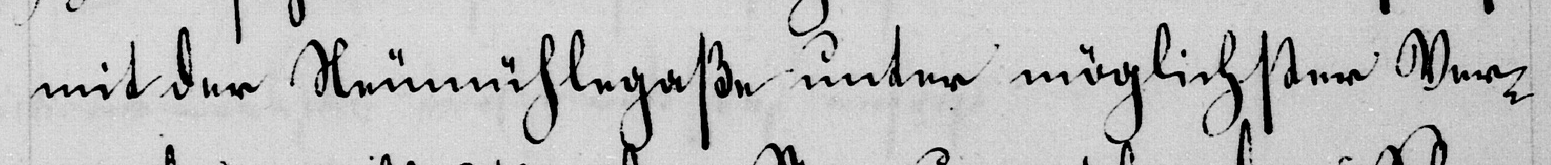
mit der Neumühlgaße unter möglichster Ver¬
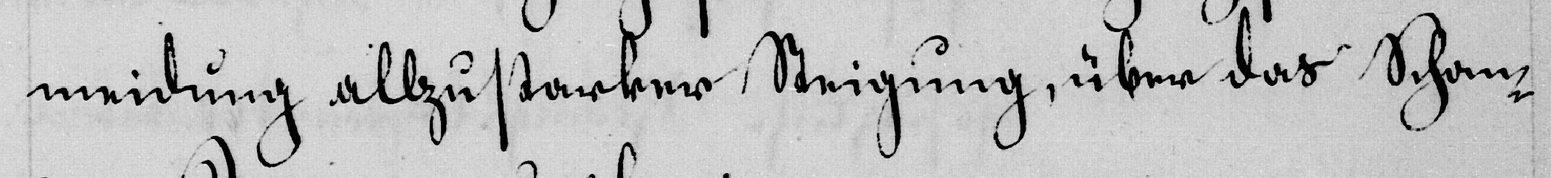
meidung allzustarker Steigung, über das Schan¬
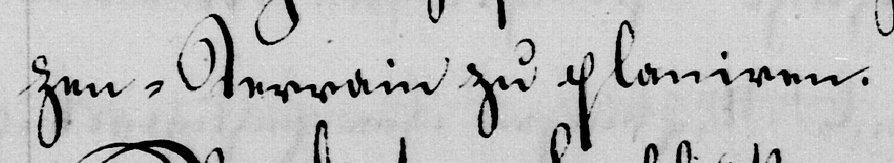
zen-Terrain zu planiren.
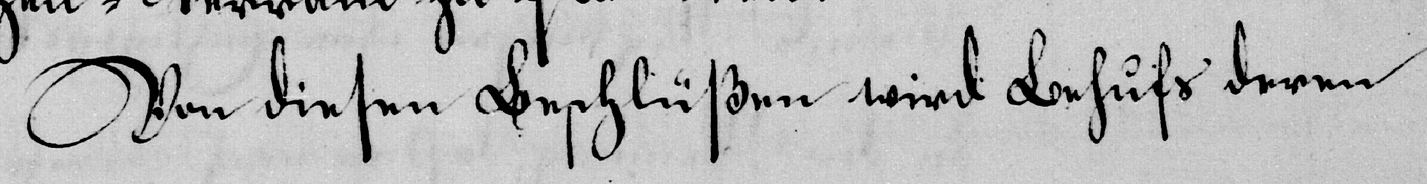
Von diesen Beschlüßen wird Behufs deren
